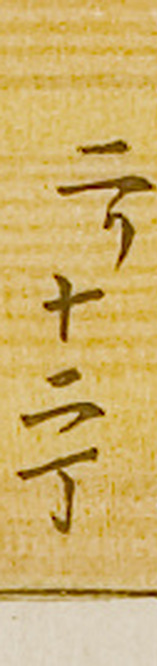ニリ十ニ丁
